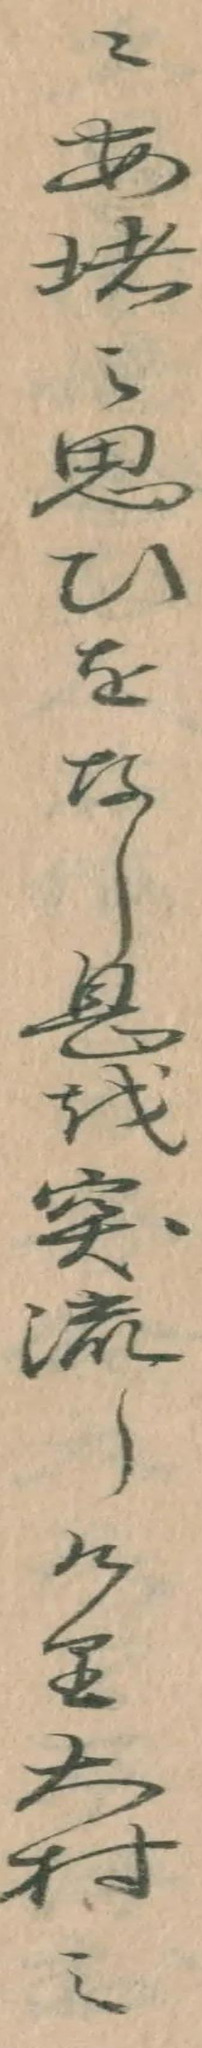々安堵之思ひをなし息を突流しけり大村之
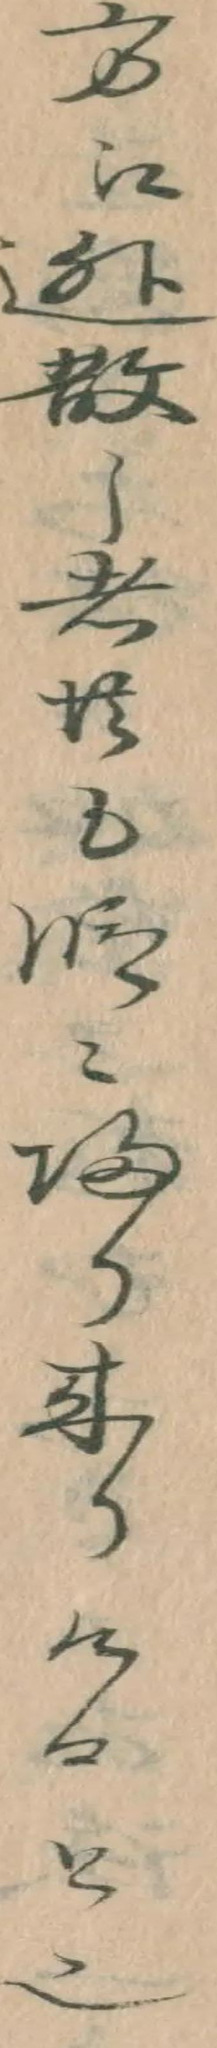方江逃散し者共も段々帰り来りけると也
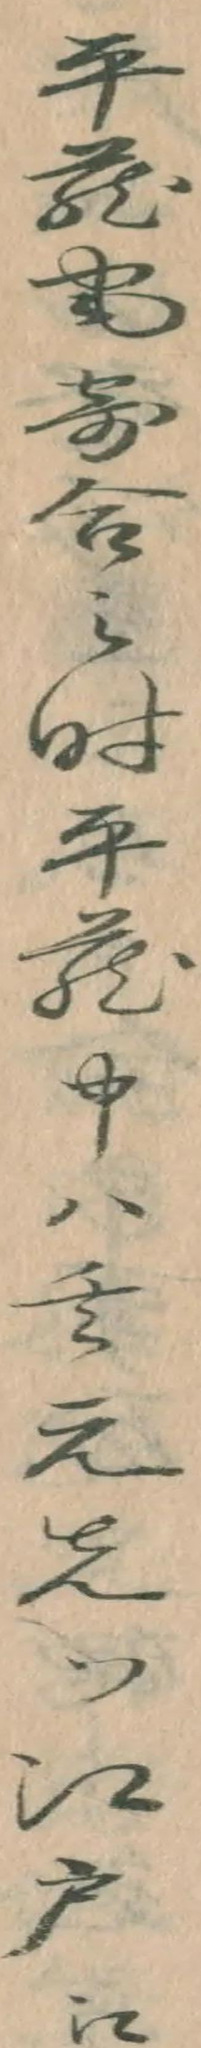平蔵も寄合の時平蔵申は其元先ッ江戸江
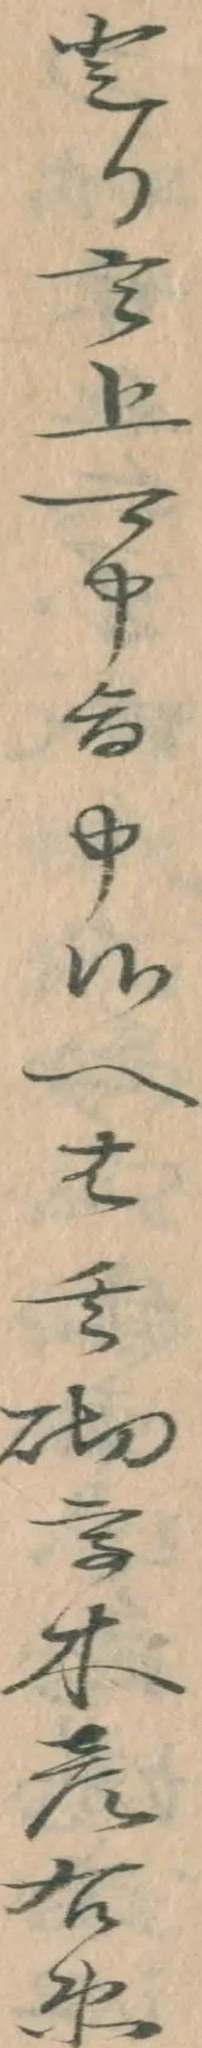登り言上可申旨申候へは其砌高木彦右衛

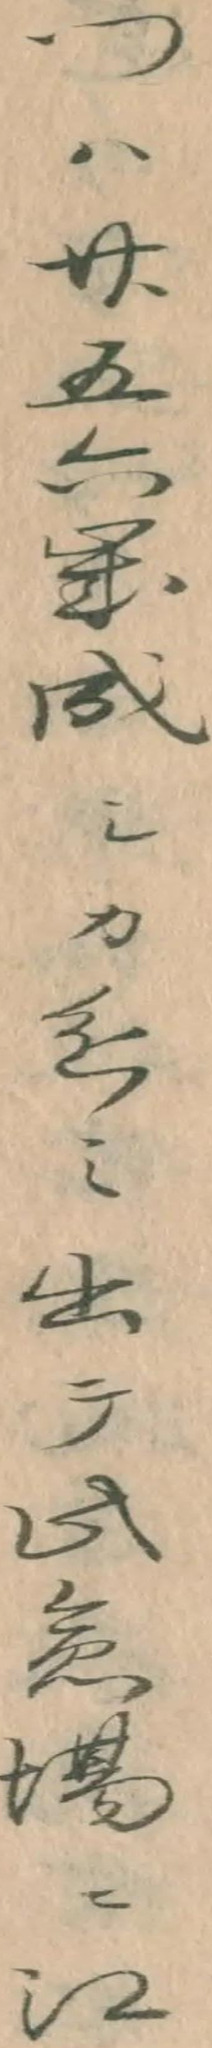門は廿五六歳成シカ進之出テ此急場に江
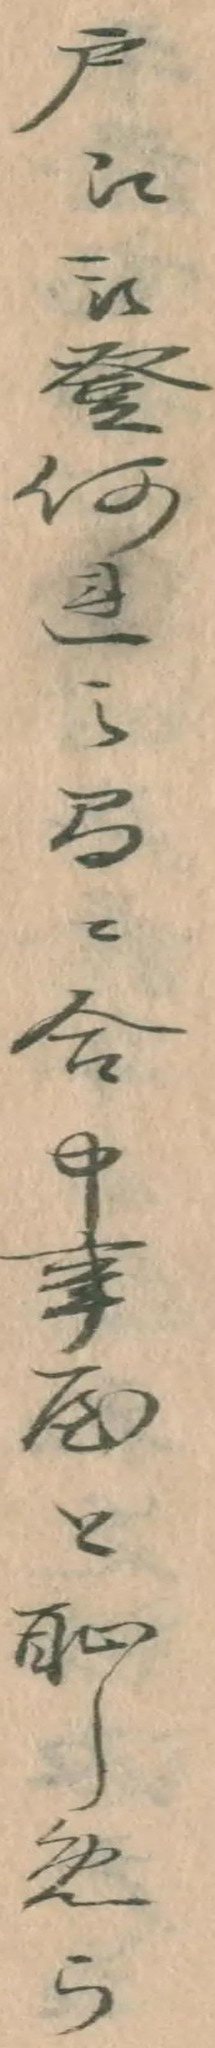戸江被登何れ之間に合申事やと恥しめら
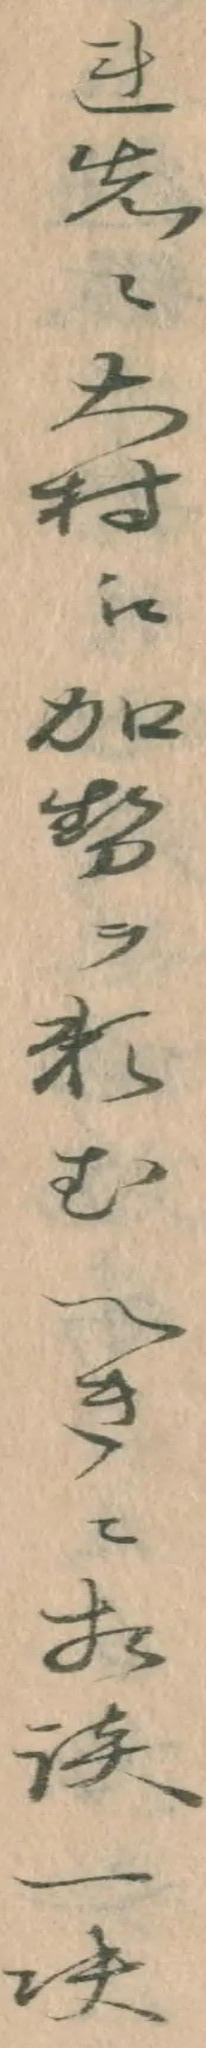れ先に大村江加勢ヲ頼むへきに相談一決
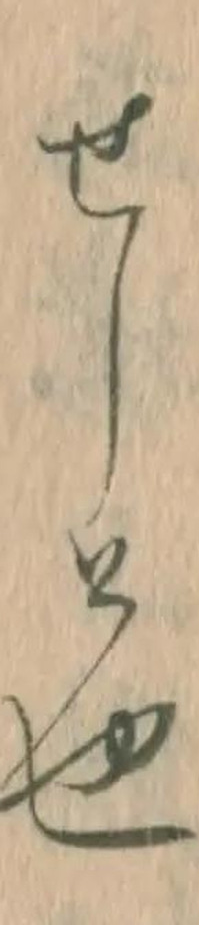せしと也
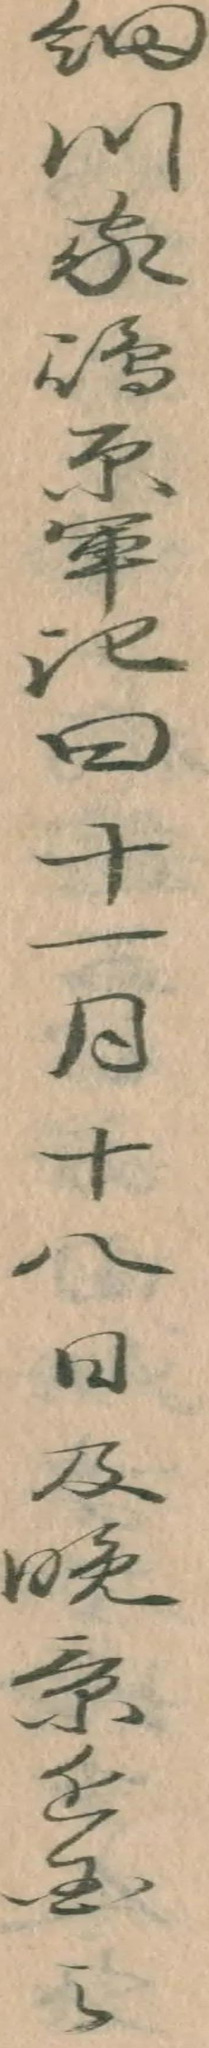細川家島原軍記曰十一月十八日及晩景近国之
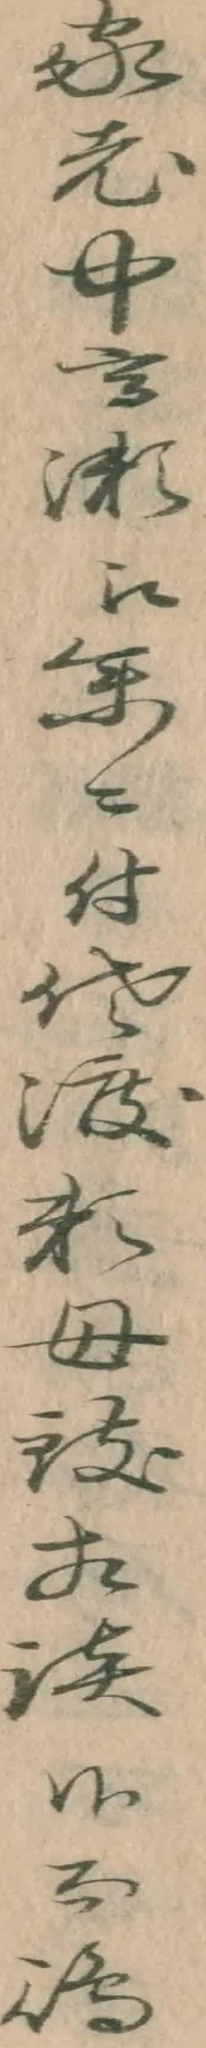家老中高瀬江参に付佐渡頼母致相談候而島
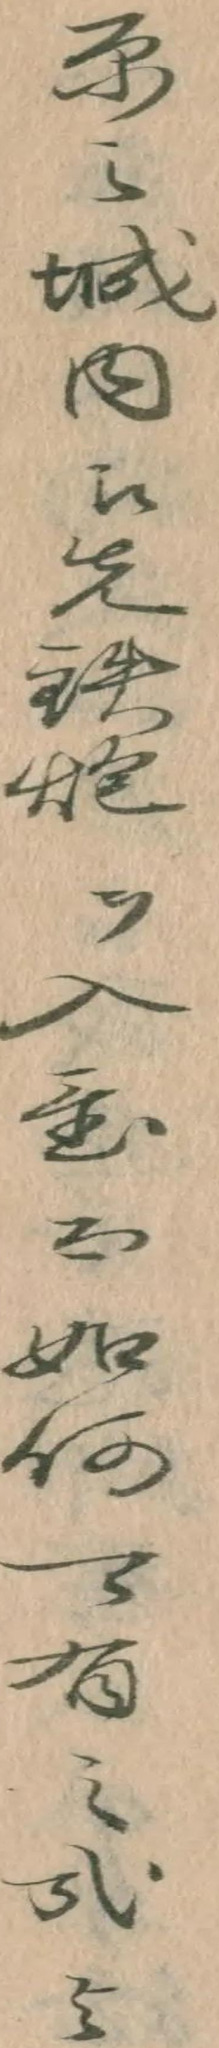原之城内江先鉄炮ヲ入置而如何可有之哉と
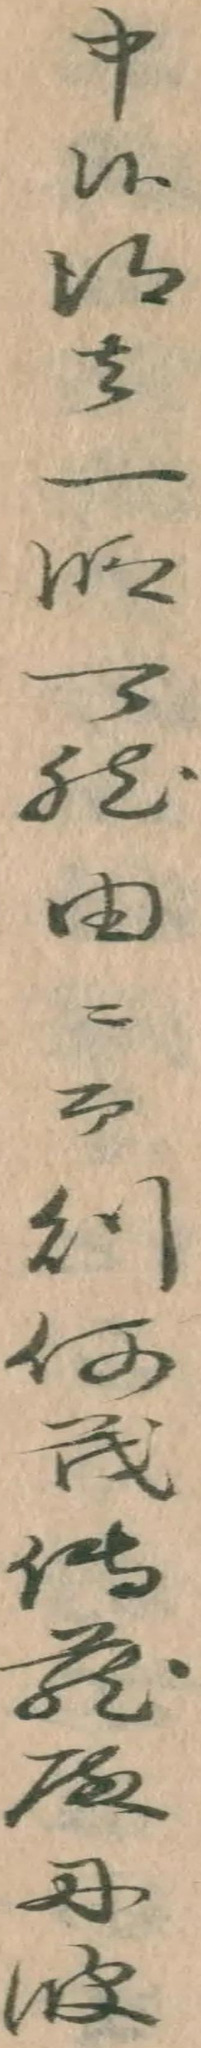申候得は一段可然由に而則何も伝蔵殿丹波
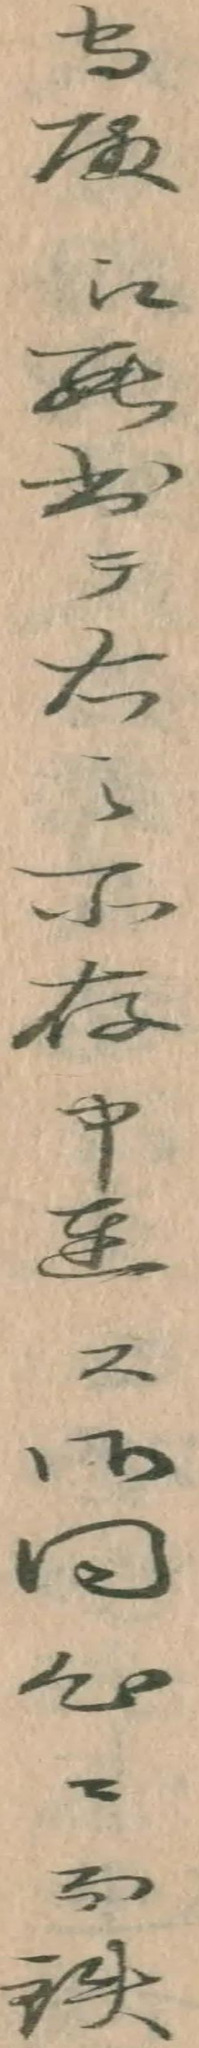守殿江罷出テ右之所存申達ス御同心に而鉄
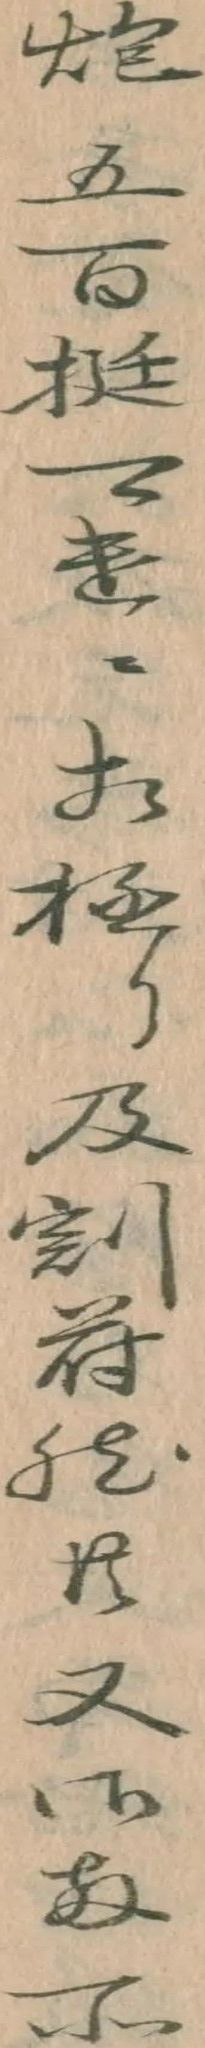炮五百挺可遣に相極り及割符然共又御両所
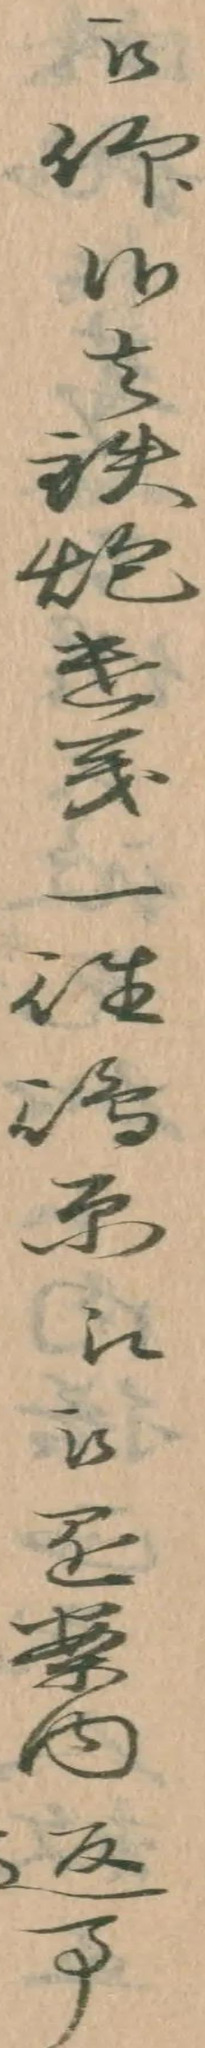被仰候は鉄炮遣義一往島原江被懸案内返事
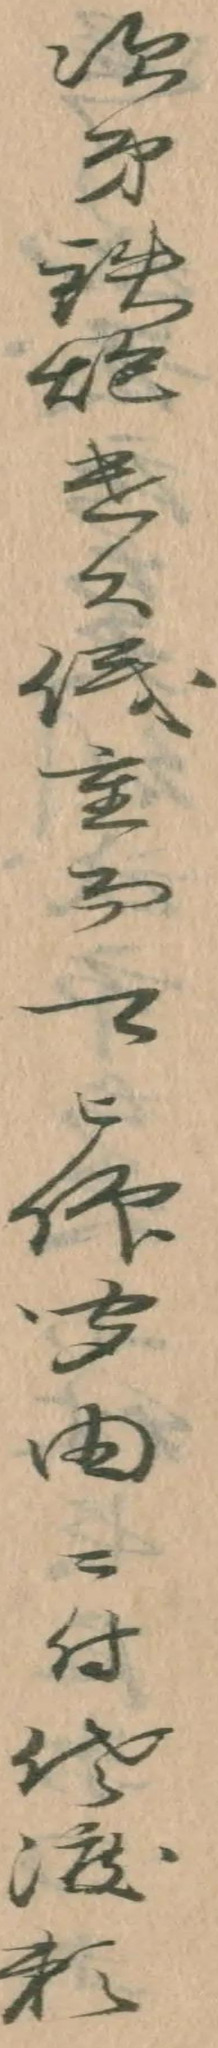次第鉄炮遣ス儀重而可被仰聞由に付佐渡頼
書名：切支丹御退治記 49巻. [3]
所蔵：国立国会図書館 National Diet Library, JAPAN
